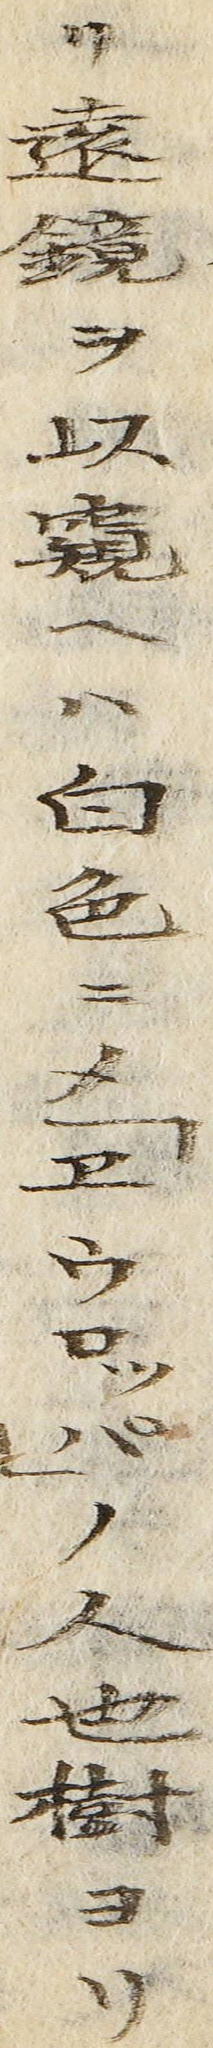リ遠鏡ヲ以窺ヘハ白色ニシテ「ヱウロッパ」ノ人也樹ヨリ
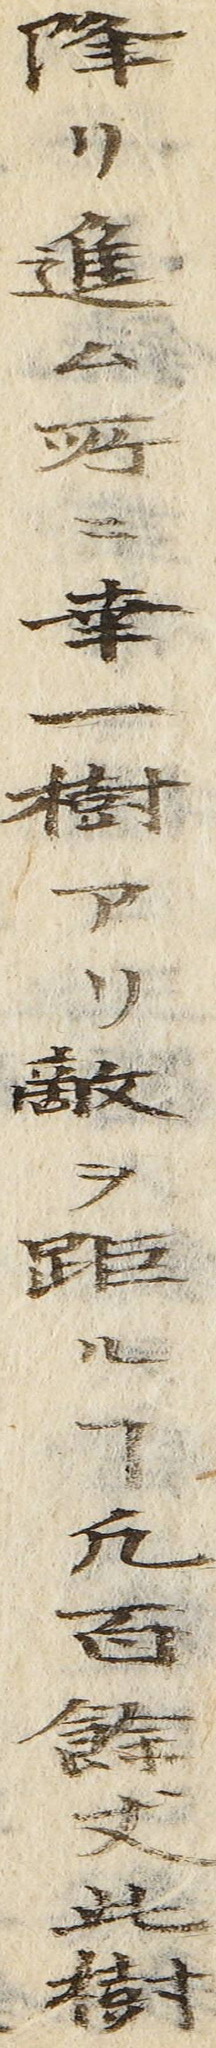降リ進ム所ニ幸一樹アリ敵ヲ距ルコト凡百余丈此樹
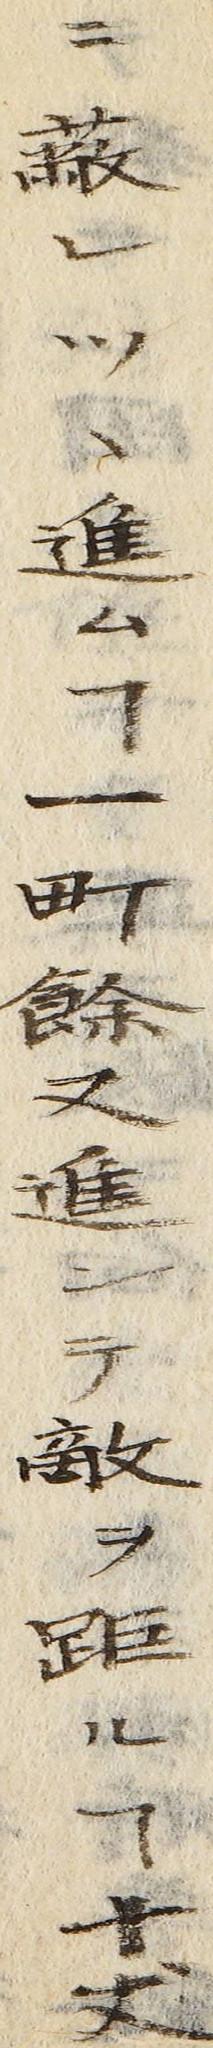ニ蔽レツヽ進ムコト一町余又進ンテ敵ヲ距ルコト十丈
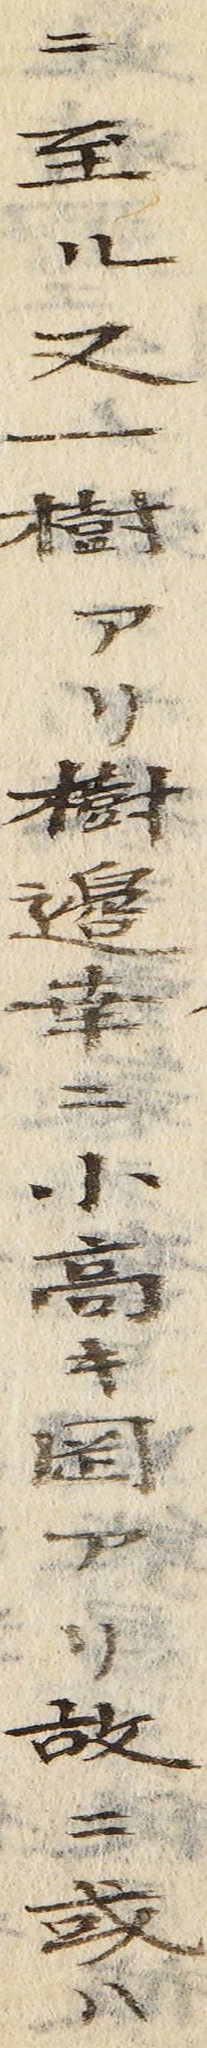ニ至ル又一樹アリ樹辺幸ニ小高キ岡アリ故ニ或ハ
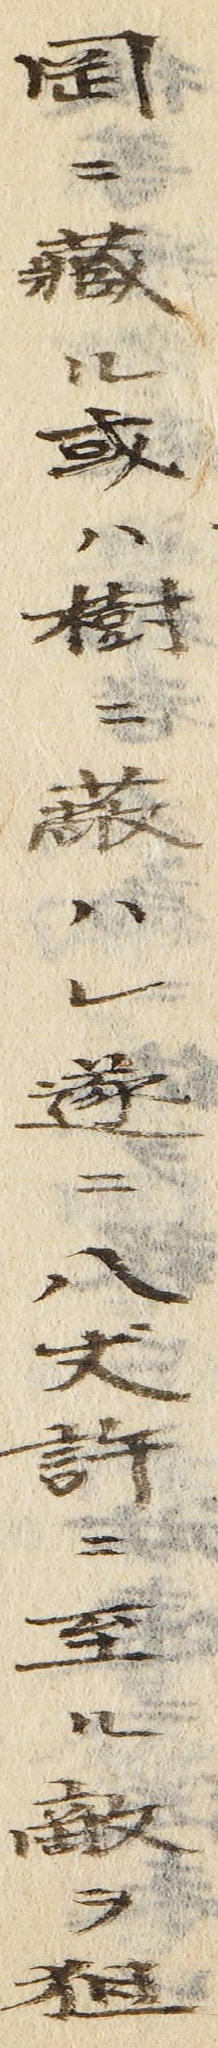岡ニ蔵ル或ハ樹ニ蔽ハレ遂ニ八丈許ニ至ル敵ヲ狙
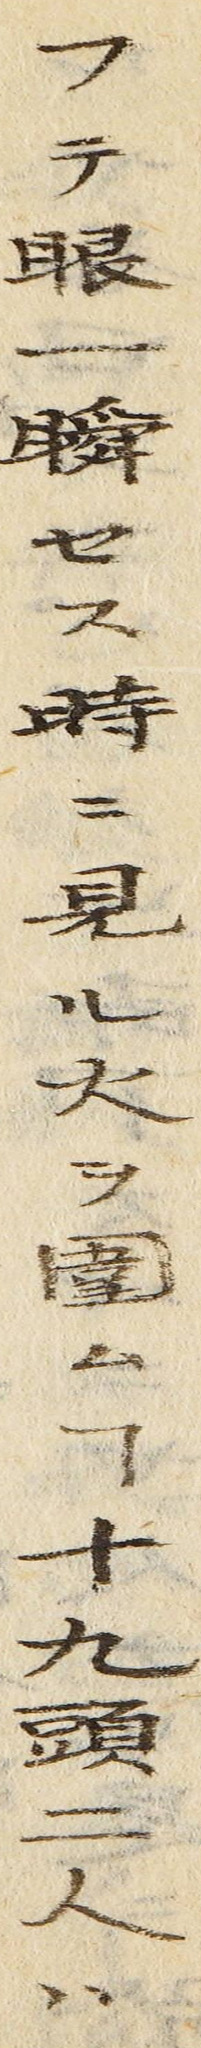フテ眼一瞬セス時ニ見ル火ヲ囲ムコト十九頭二人ハ
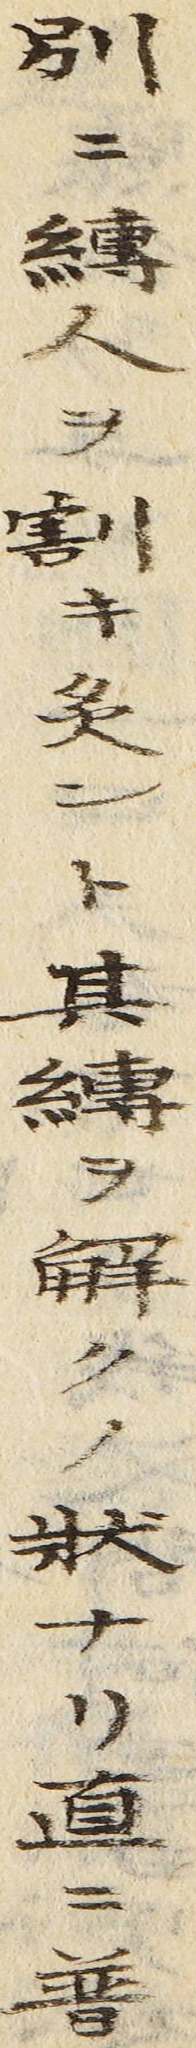別ニ縛人ヲ割キ炙ント其縛ヲ解クノ状ナリ直ニ普
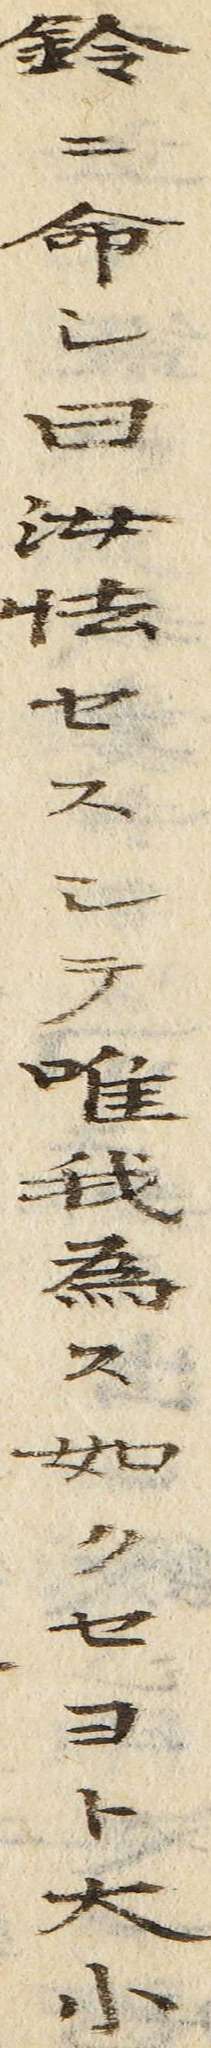鈴ニ命シ曰汝怯セスシテ唯我為ス如クセヨト大小
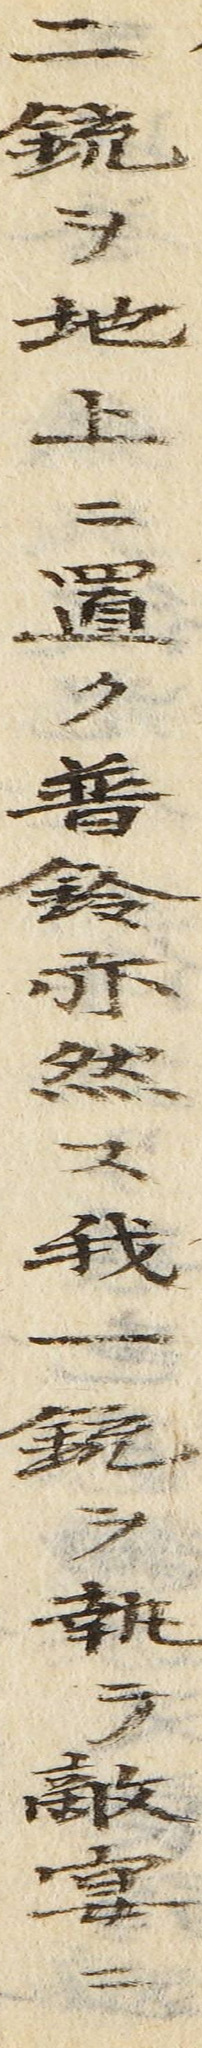二銃ヲ地上ニ置ク普鈴亦然ス我一銃ヲ執テ敵宴ニ
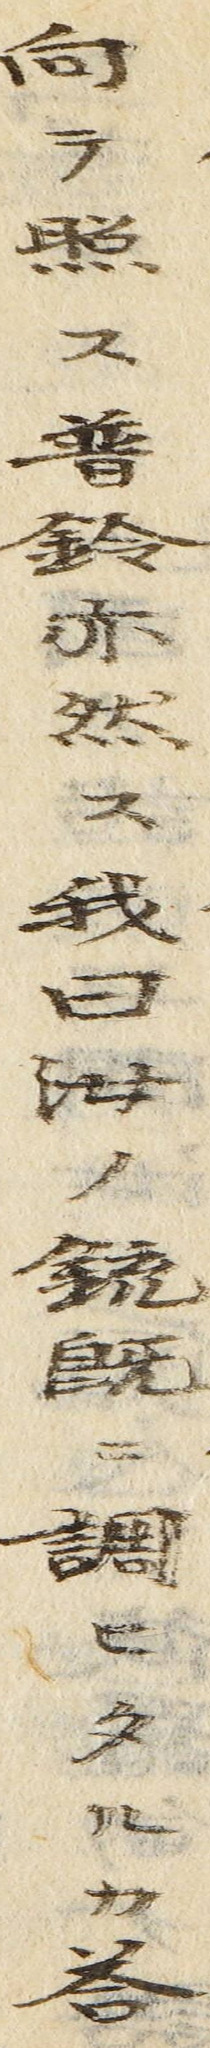向テ照ス普鈴亦然ス我曰汝ノ銃既ニ調ヒタルカ答
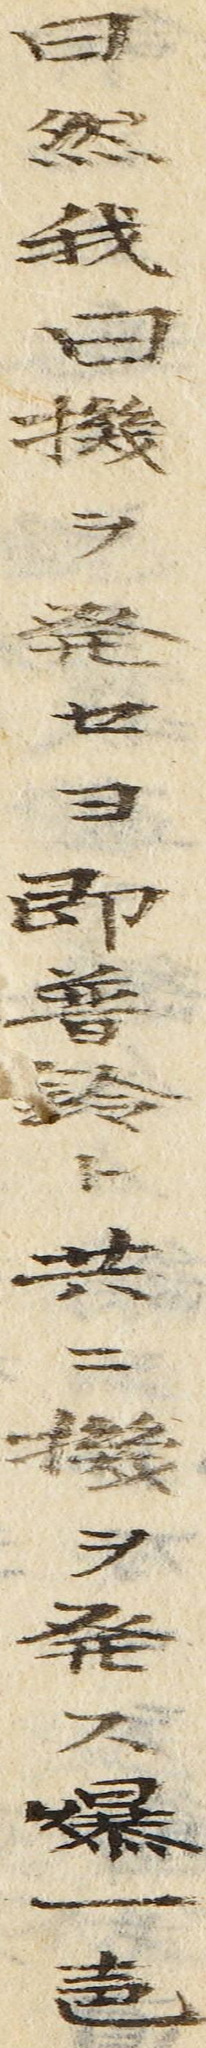曰然我曰機ヲ発セヨ即普鈴ト共ニ機ヲ発ス爆一声
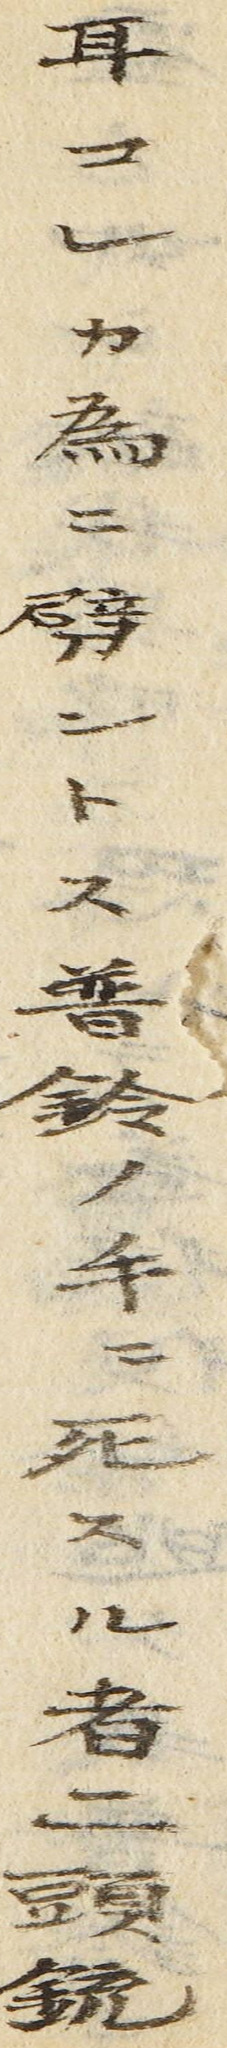耳コレカ為ニ劈ントス普鈴ノ手ニ死スル者二頭銃
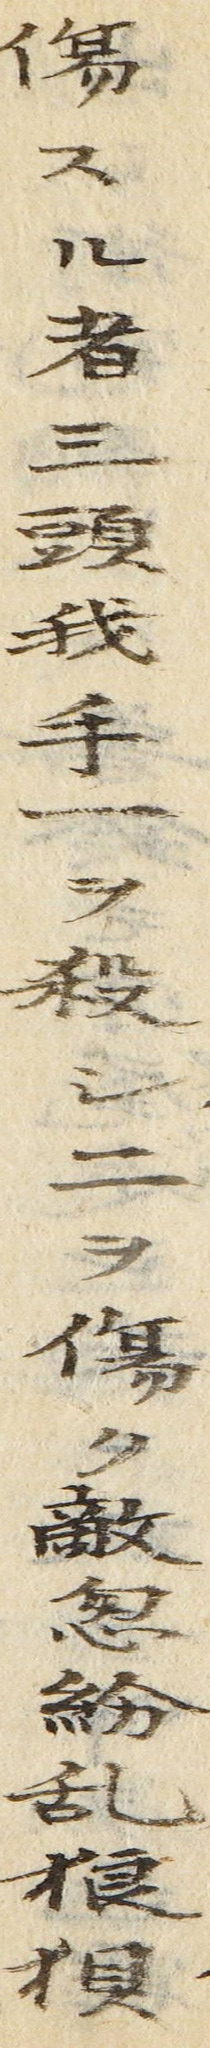傷スル者三頭我手一ヲ殺シ二ヲ傷ク敵忽紛乱狼狽
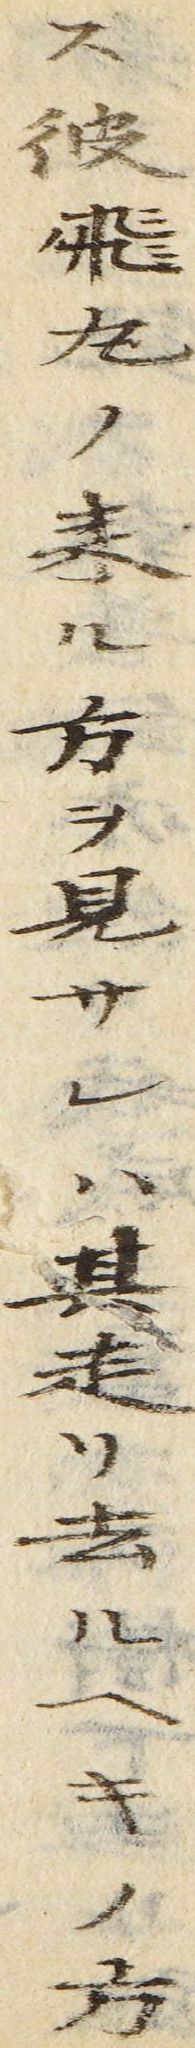ス彼飛丸ノ来ル方ヲ見サレハ其走リ去ルヘキノ方
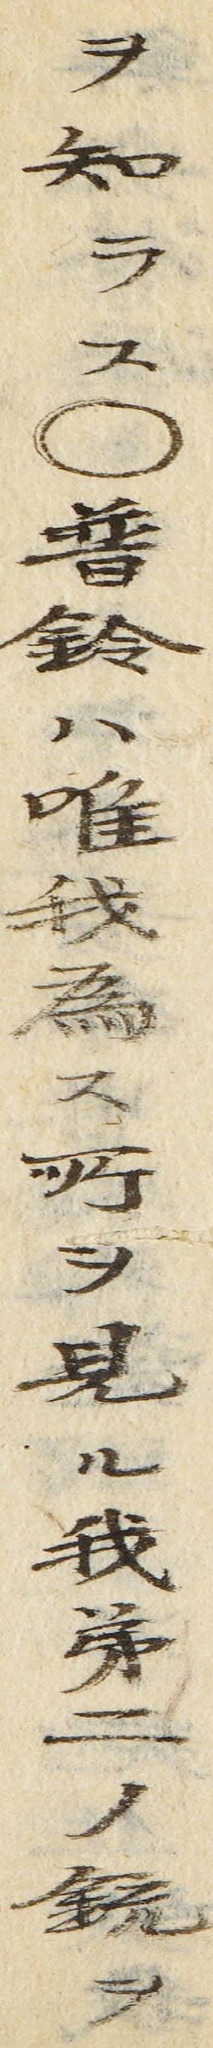ヲ知ラス◯普鈴ハ唯我為ス所ヲ見ル我第二ノ銃ヲ
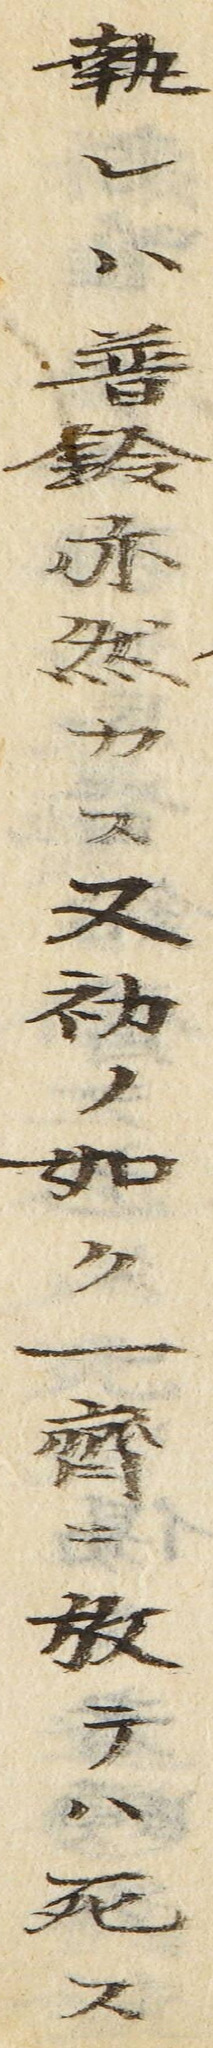執レハ普鈴亦然カス又初ノ如ク一斉ニ放テハ死ス
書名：漂流紀事
